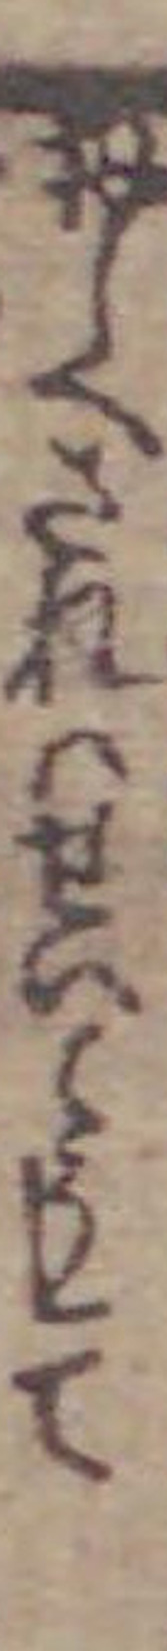おしへされはせいてうして
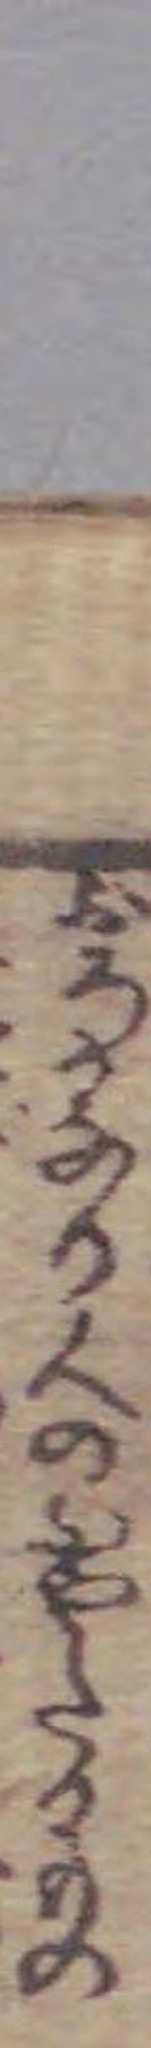おろかなり人のおやたるもの
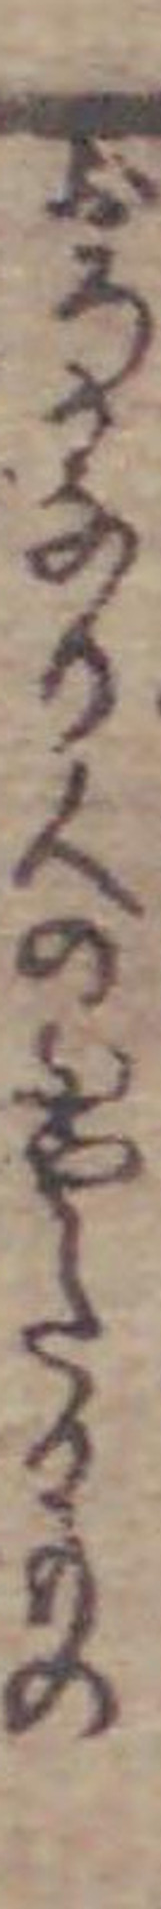おろかなり人のおやたるもの
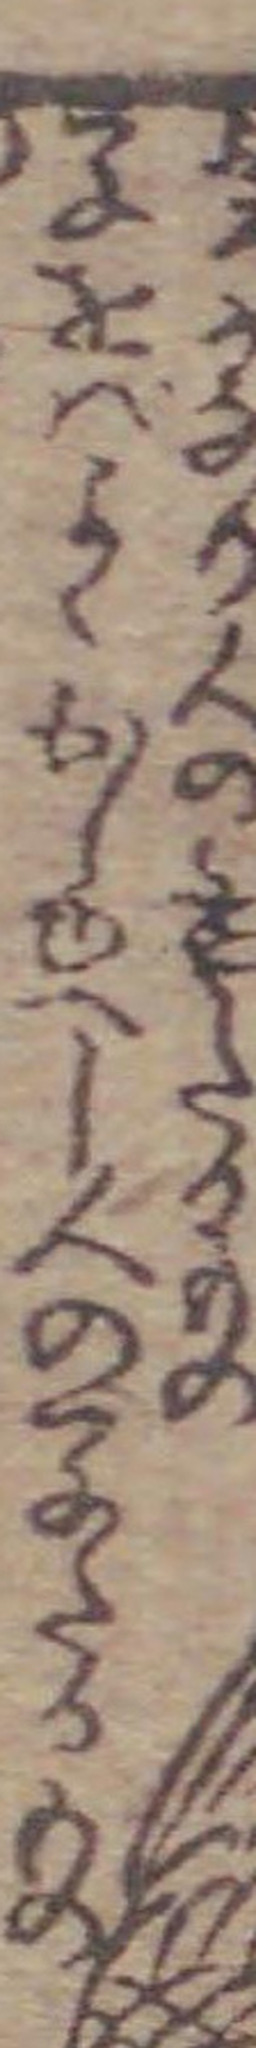子をばよくおしゆへし人の子たるもの
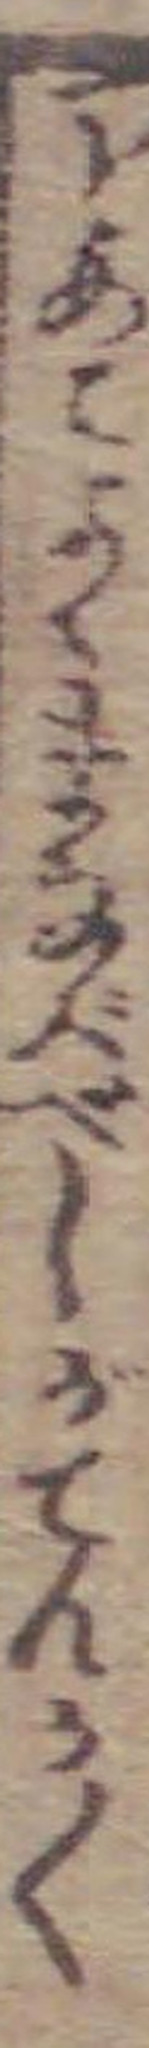つとめてよくまなべしがてんか〳〵

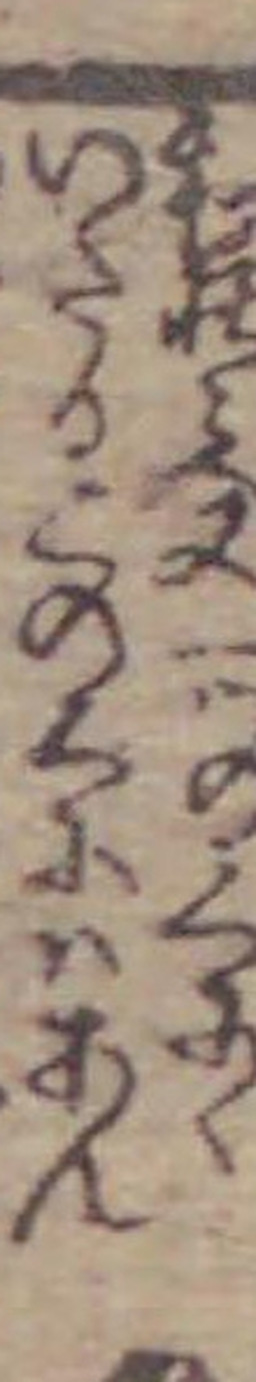いたるこのくにはあん
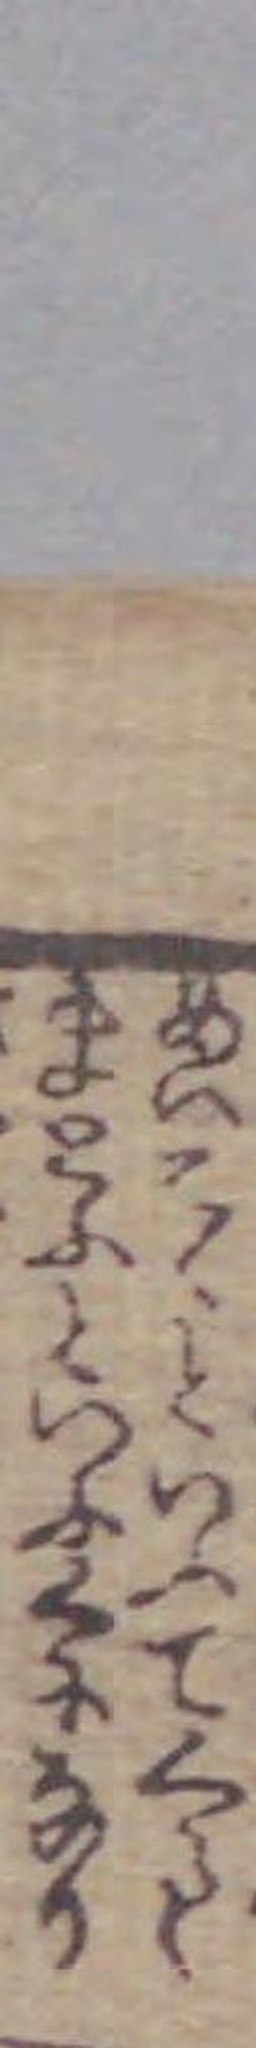まとふといふくになり
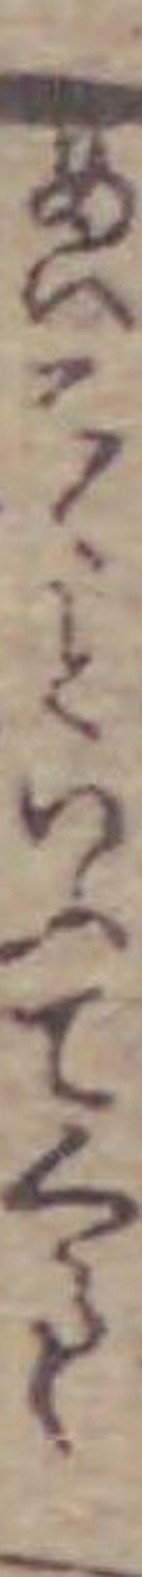めいこくといふてくらく
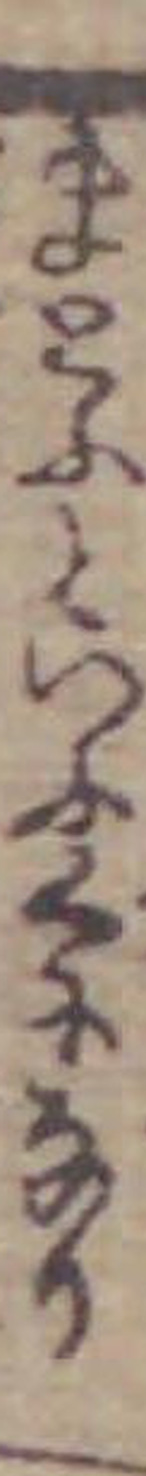まとふといふくになり
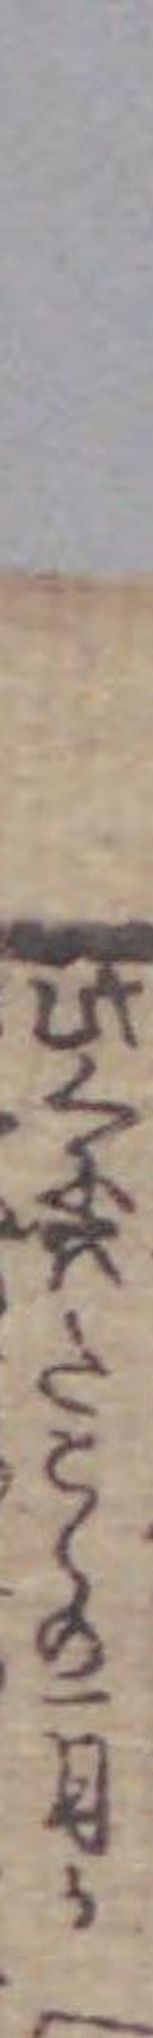此くにはたこくの一月か
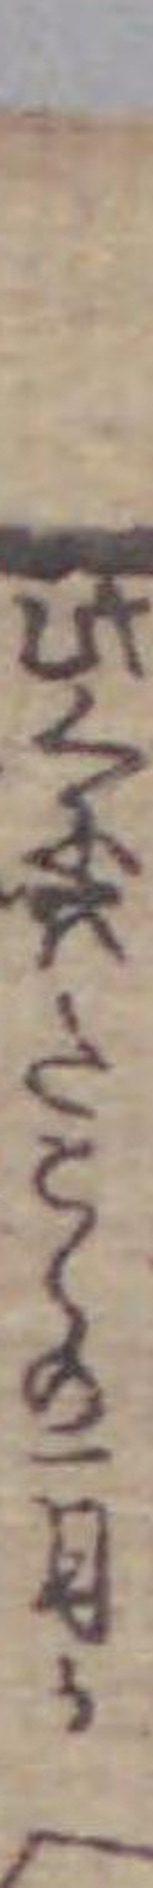此くにはたこくの一月か
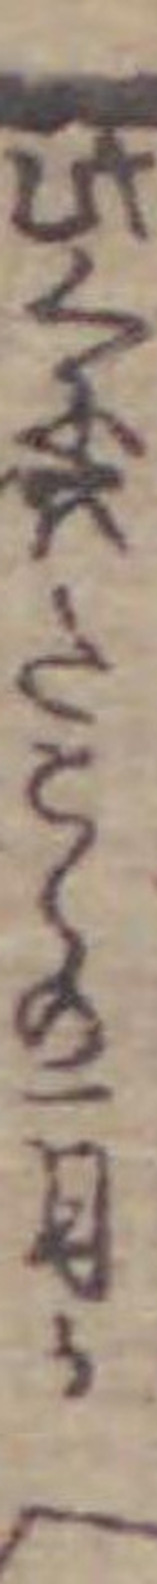此くにはたこくの一月か
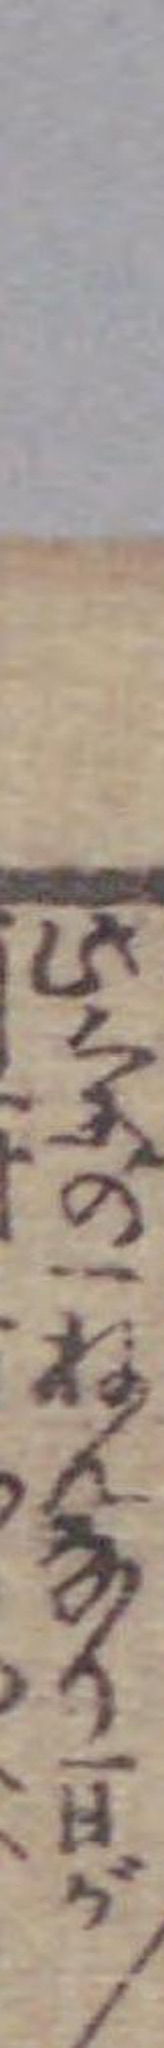此くにの一ねんなり一日が
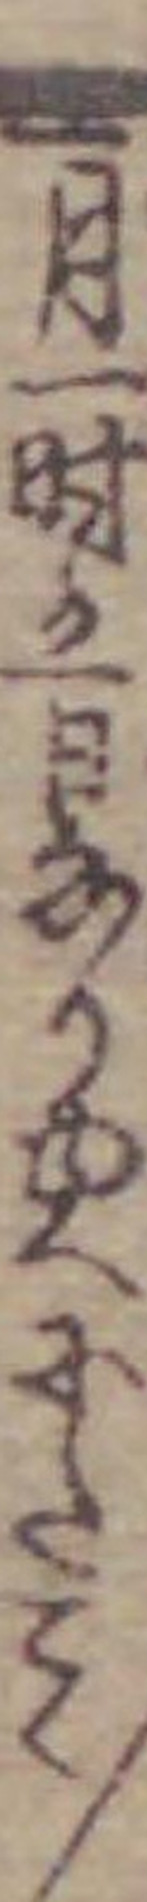一月一時か一日なりゆへにたこく
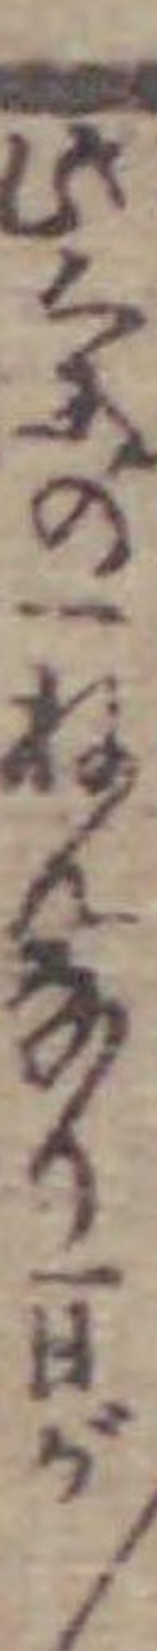此くにの一ねんなり一日が
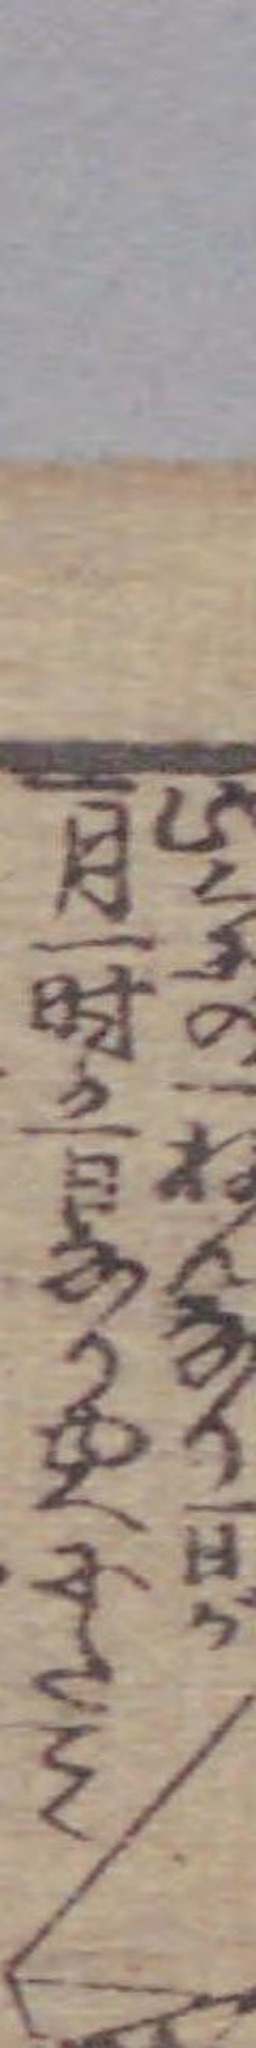一月一時か一日なりゆへにたこく
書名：和荘兵衛後日話 : 3巻
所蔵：国立国会図書館 National Diet Library, JAPAN
